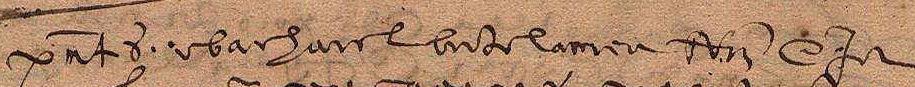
pm̄t 8. o bacharel bertolameu ffrz̄ e Jor
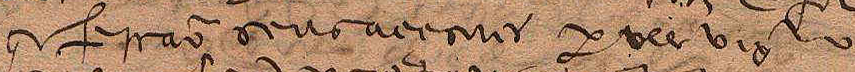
ge ferraõ seus acesores ꝑ elle vigro
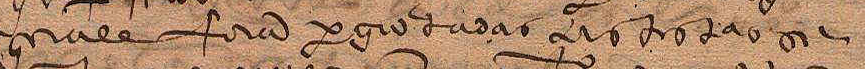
gerall fora̅ ꝑgūtadas as testas se
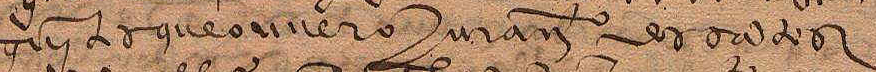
guj̄tes que ouuerō Juramto dos sātos
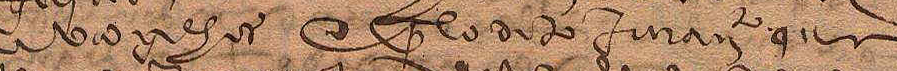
avāgelhos e p̄lo dito Juramto que
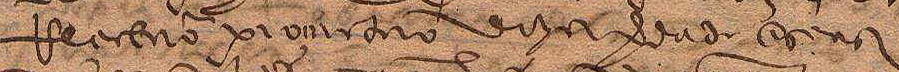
Receberō prometerō dizer ꝟdade e seus
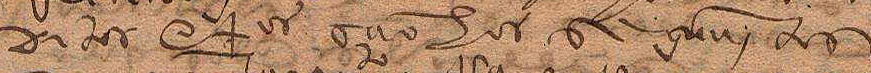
Ditos e tos saõ hos seguuj̄tes
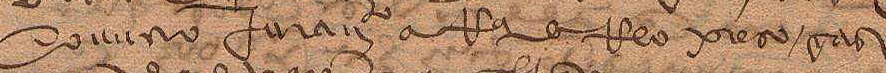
e ouuerō Juramto a Ra do Reo preso / gas
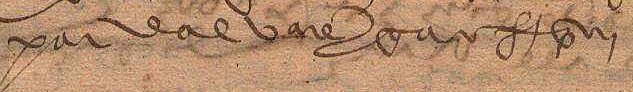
par dalvarēga o stp̄vj
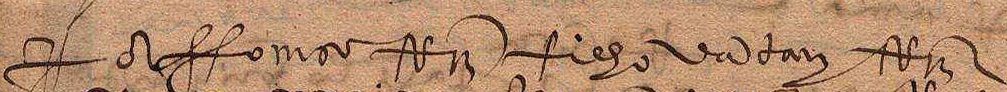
item Affomso ffr̄z filho dātam ffrz
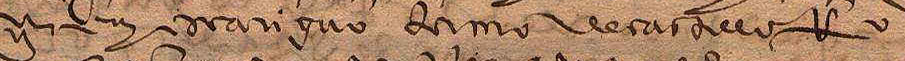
mor em escariguo termo de castello Ro
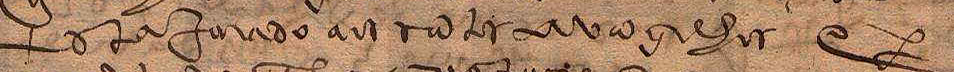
testa Jurado aos sātos avāgelhos e ꝑ
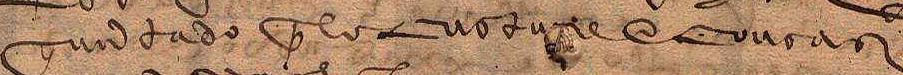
guūtado p̄lo custume e cousas
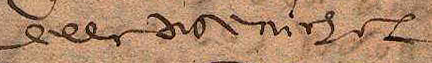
delle dise nicheL
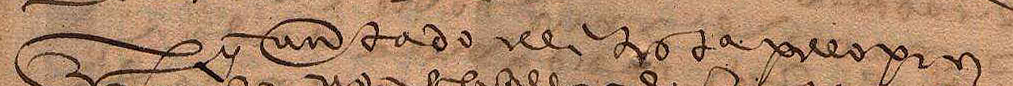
item ꝑguūtado elle testa pello pry
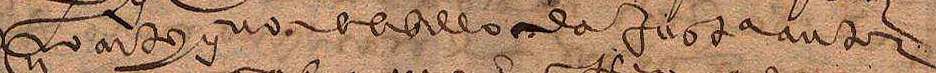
mro artyguo do libello da Justa autor
